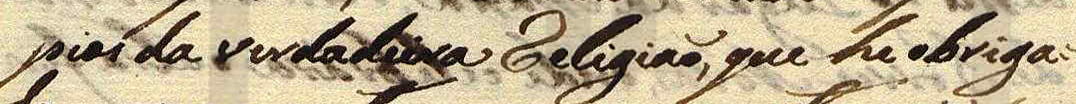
pios da verdadeira Religiaõ, que he obriga
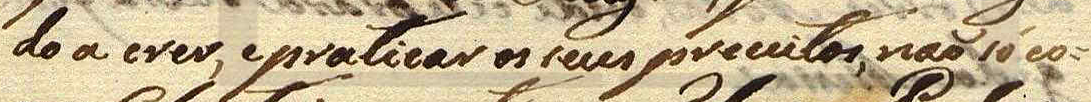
do a crer, e praticar os seus preceitos, naõ só co
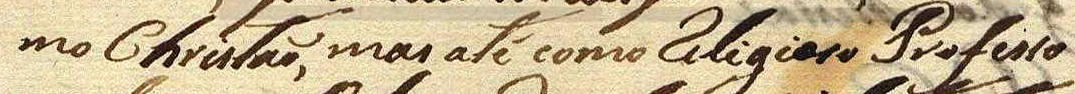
mo Christaõ, mas até como Religioso Professo
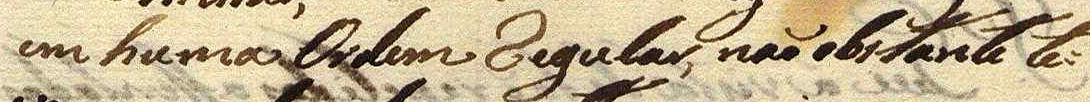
em huma Ordem Regular, naõ obstante te
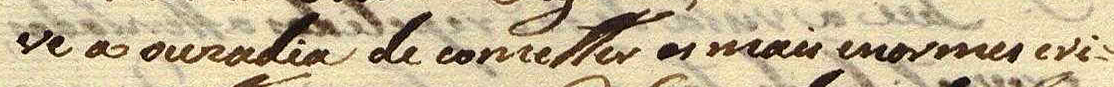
ve a ouzadia de cometter os mais enormes cri
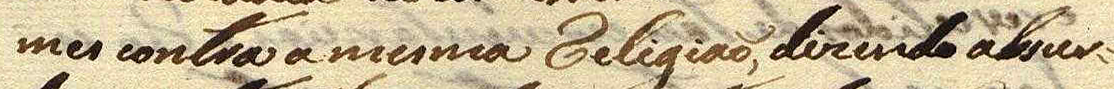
mes contra a mesma Religiaõ, dizendo absur
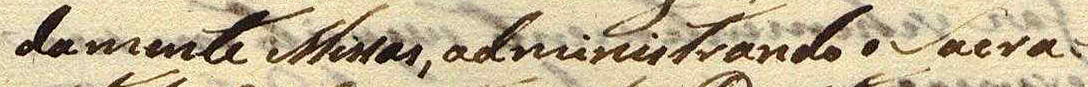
damente Missas, administrando o Sacra
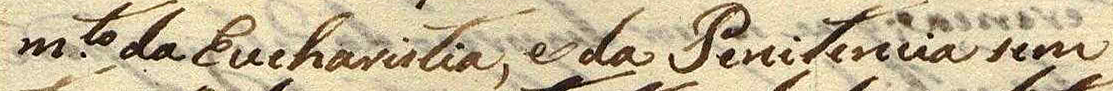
m.to da Eucharistia, e da Penitencia sem
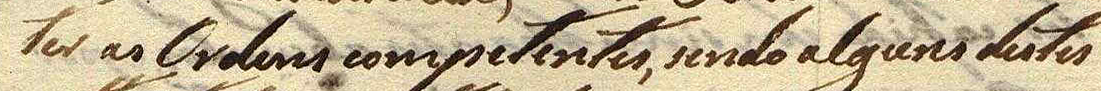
ter as Ordens competentes, sendo alguns destes
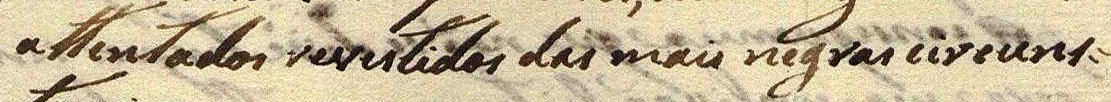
attentados revestidos das mais negras circuns
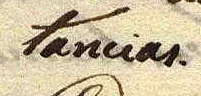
tancias.
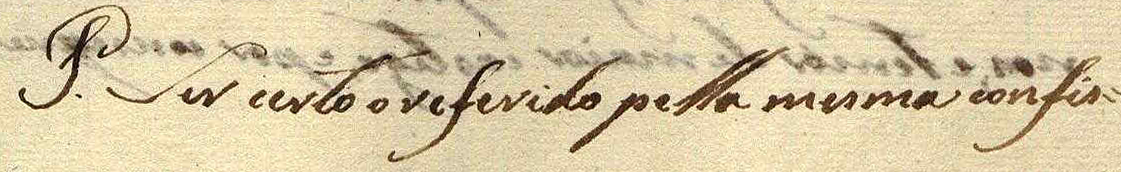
P. Ser certo o referido pella mesma confis
